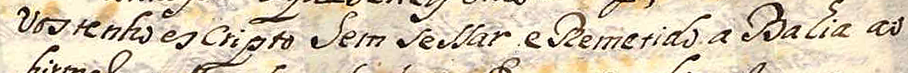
vos tenho escripto sem sessar e Remetido a Bahia ao
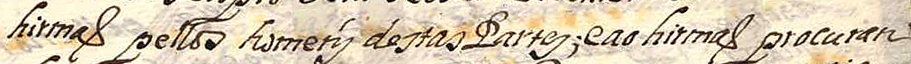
hirmaõ pellos homen̄s destas Partes; e ao hirmaõ procuran
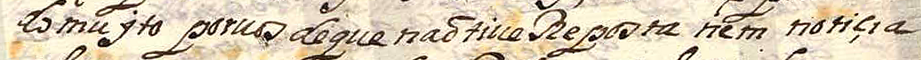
do muyto por uos de que naõ tiue Reposta nem noticia
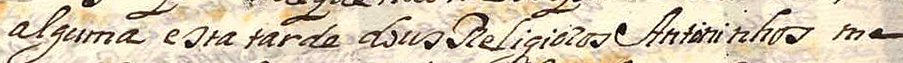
alguma esta tarde dous Religiozos Antoninhos me
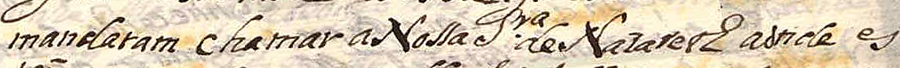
mandaram chamar a Nossa S.ra de Nazareth aonde es
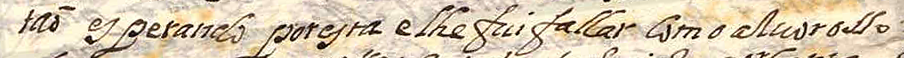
taõ esperando por esta e lhe fui fallar Com o aluorosso
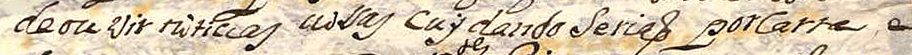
de ouvir noticias uossas cuydando seriaõ por carta e
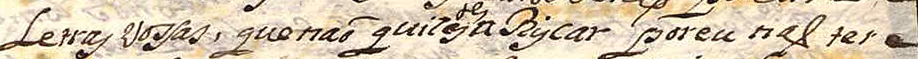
Letras vossas, que naõ quizestes aRiscar por eu naõ ter a
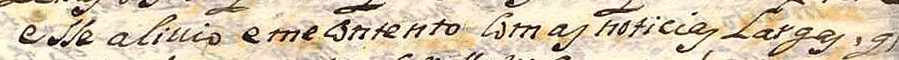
esse aliuio e me contento com as noticias Largas, q̄
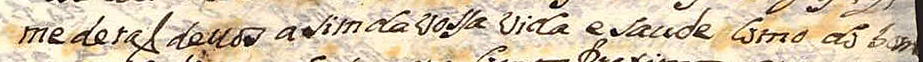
me deraõ de uos asim da vossa vida e saude Como do bom
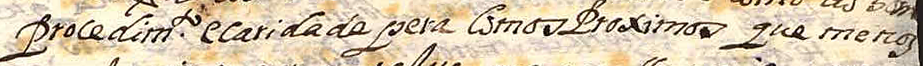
procedim.to e caridade pera Com os Proximos que menos
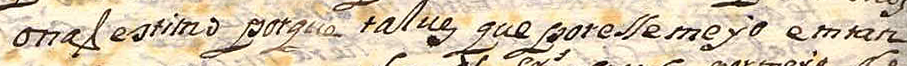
o naõ estimo porquo talues que por esse meyo emtan
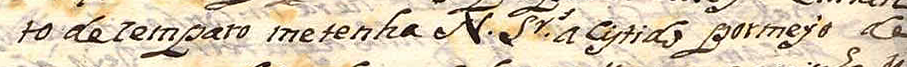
to dezemparo me tenha N. Sr̄. acistido por meyo de
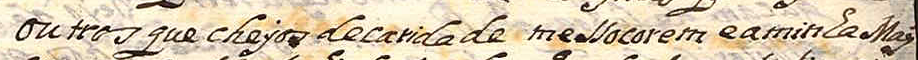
outros que cheyos de caridade me ssocorem e a minha May
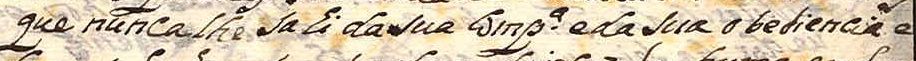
que nunca lhe sahi da sua comp.a e da sua obediencia e
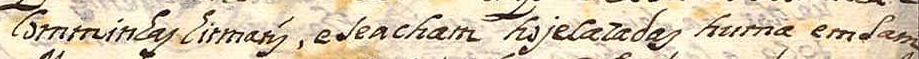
Com minhas hirman̄s, e se acham hoje cazadas huma em sam
